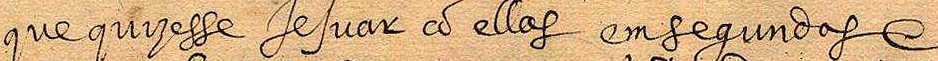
que quizesse Jejuar cō ellas em segundas e
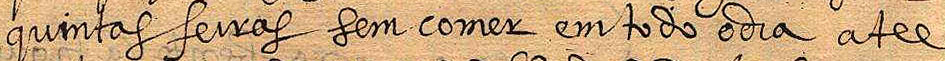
quintas feiras sem comer em todo o dia atee
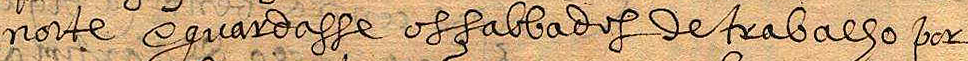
noite e guardasse os sabbados de trabalho por
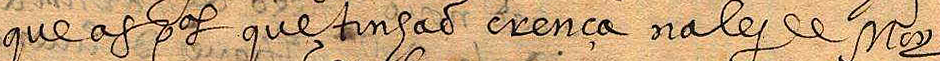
que as pas que tinhaõ crença na lej de Moy
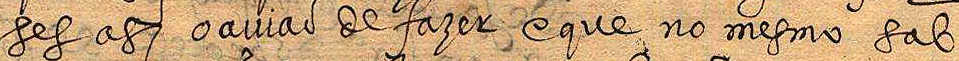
ses asj o auiaõ de fazer e que no mesmo sab
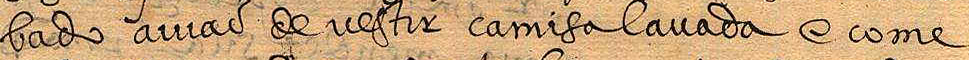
bado auiaõ de uestir camisa lauada e come
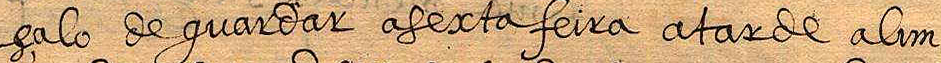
çalo de guardar a sexta feira a tarde alim
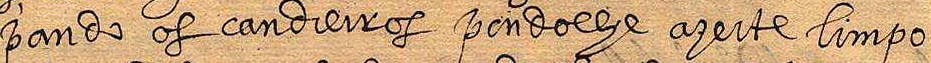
pando os candierios pondolhe azeite limpo
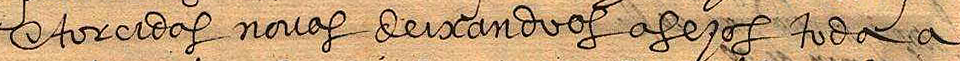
e torcidas nouas deixandoos asezos toda a
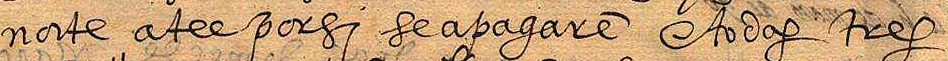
noite atee por sj se apagarē e todas tres
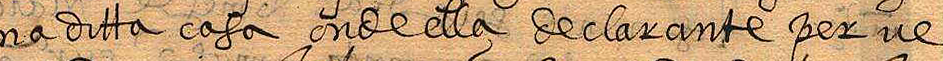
na ditta casa onde ella declarante per ue
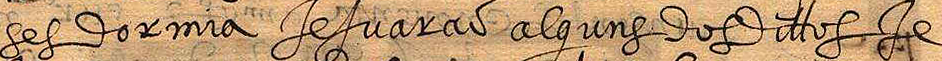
ses dormia JeJuaraõ alguns dos dittos Je
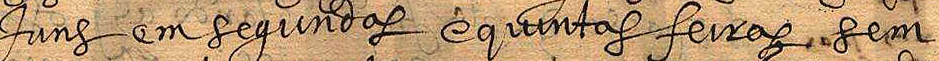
Juns em segundas e quintas feiras sem
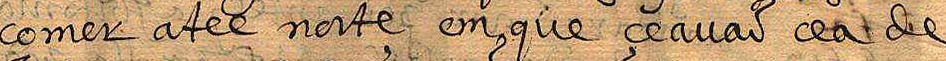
comer atee noite em que çeauaõ cea de
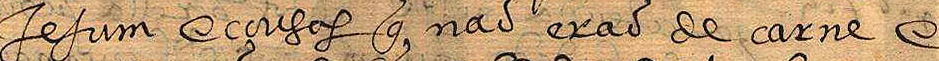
JeJum e cousas q̄ naõ eraõ de carne e
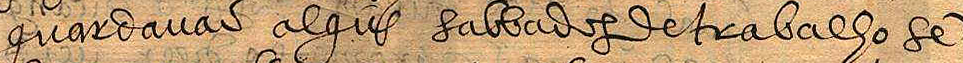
guardauaõ algūs sabbados de trabalho sē
